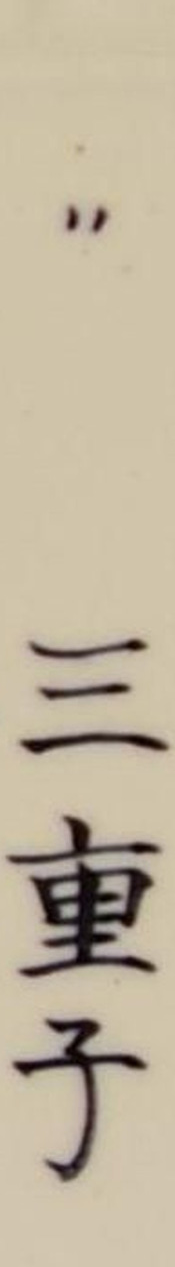三重子
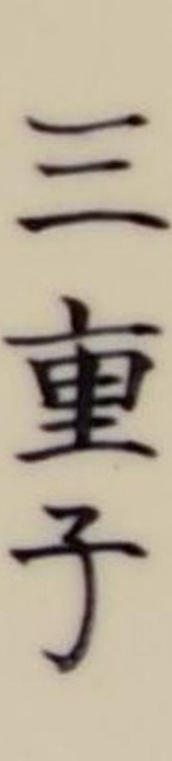三重子
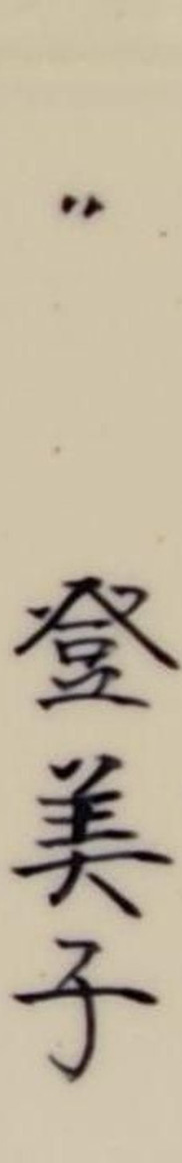登美子
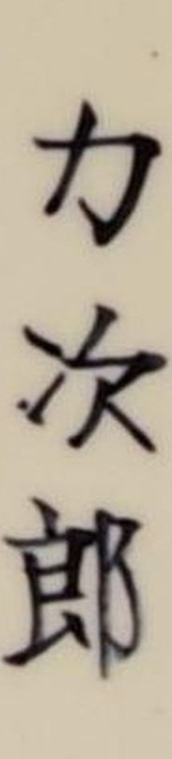力次郎
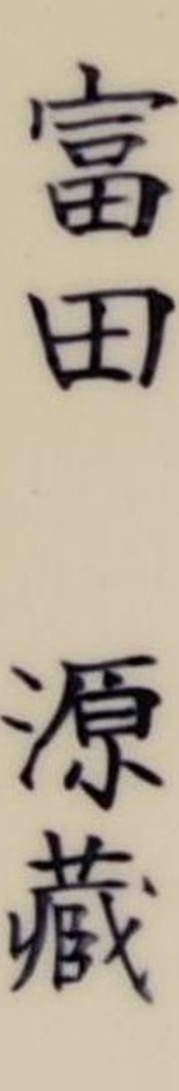富田源蔵
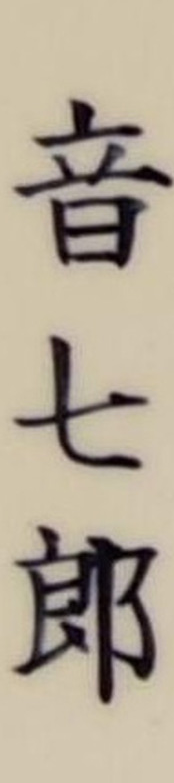音七郎
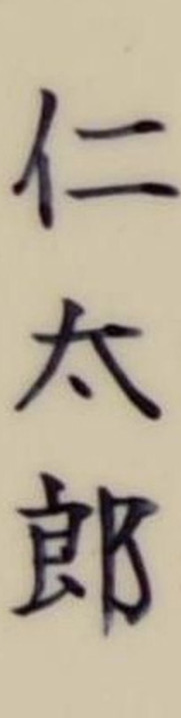仁太郎
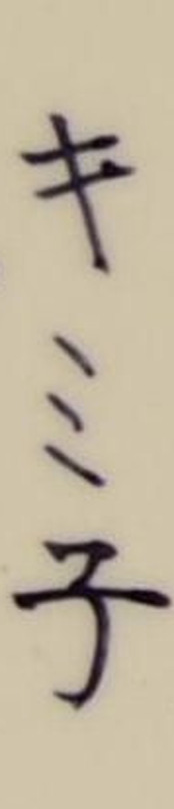キミ子
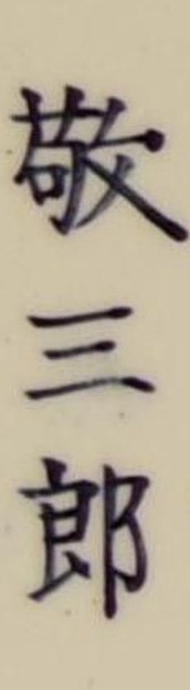敬三郎
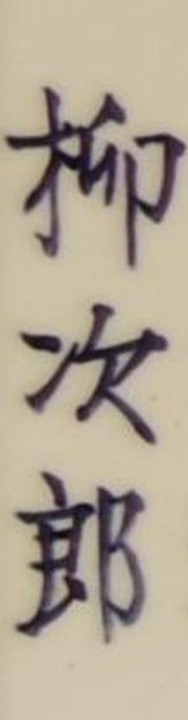柳次郎

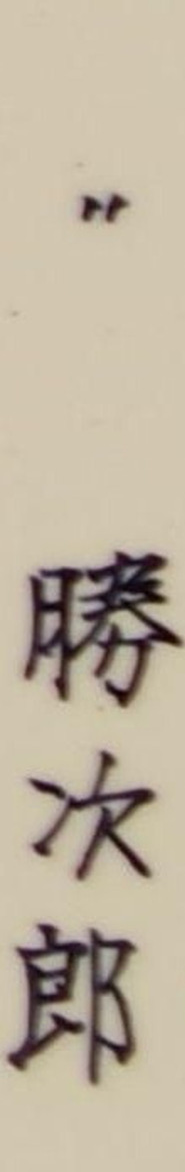勝次郎
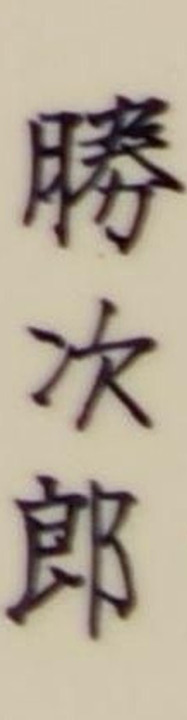勝次郎
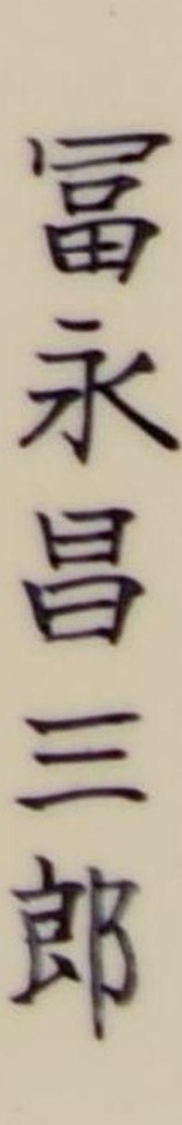冨永昌三郎
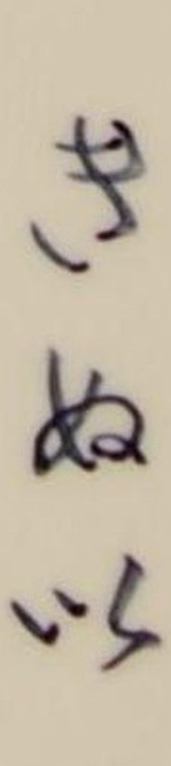きぬい
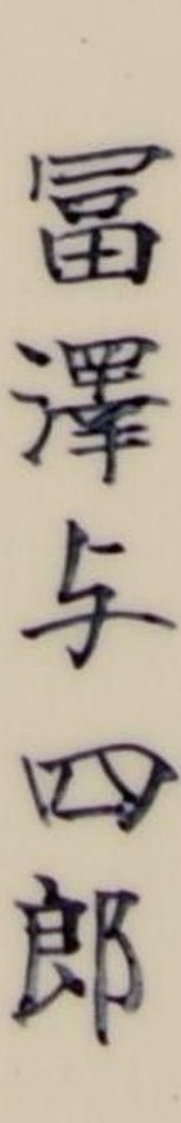冨澤与四郎
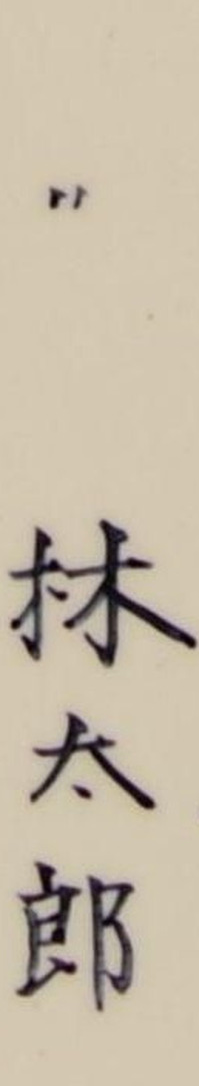林太郎
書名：A~D
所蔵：koyasan kongobuji
